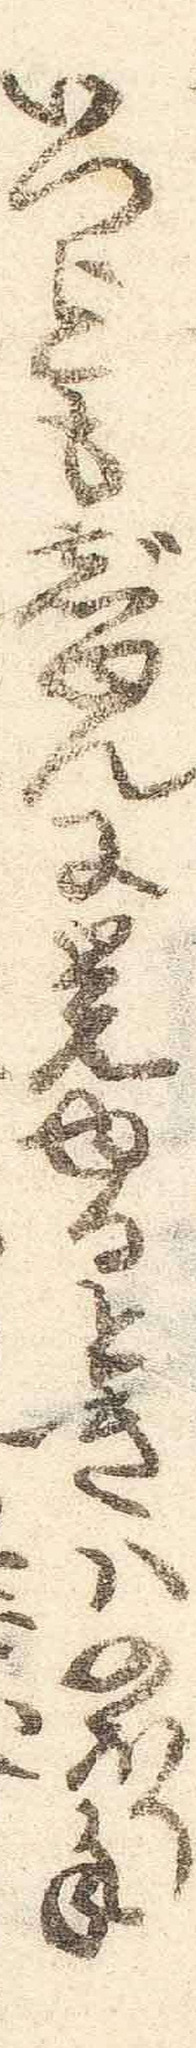いつ迄もじゆんに覚ゆるときはのほり手
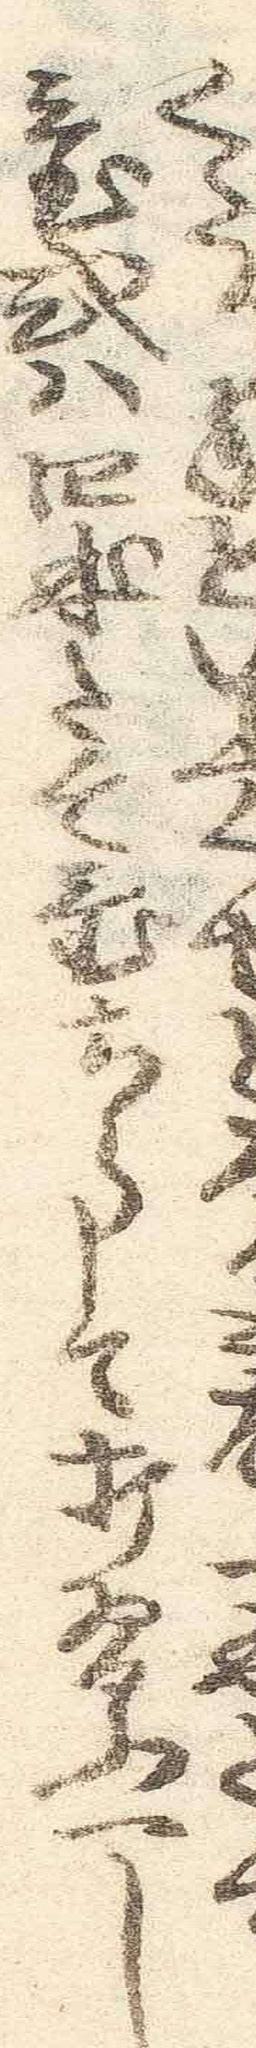置或は四本たて置ちらして打習ふへし
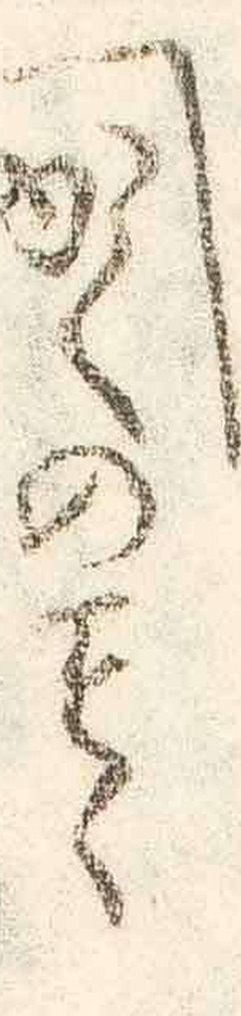かくのことく
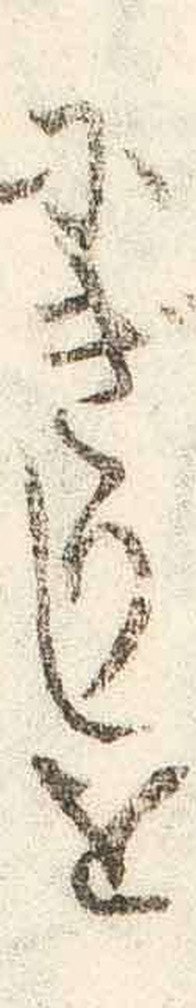にぎりしを
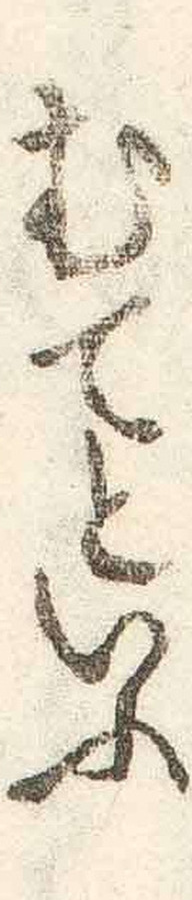むてといふ
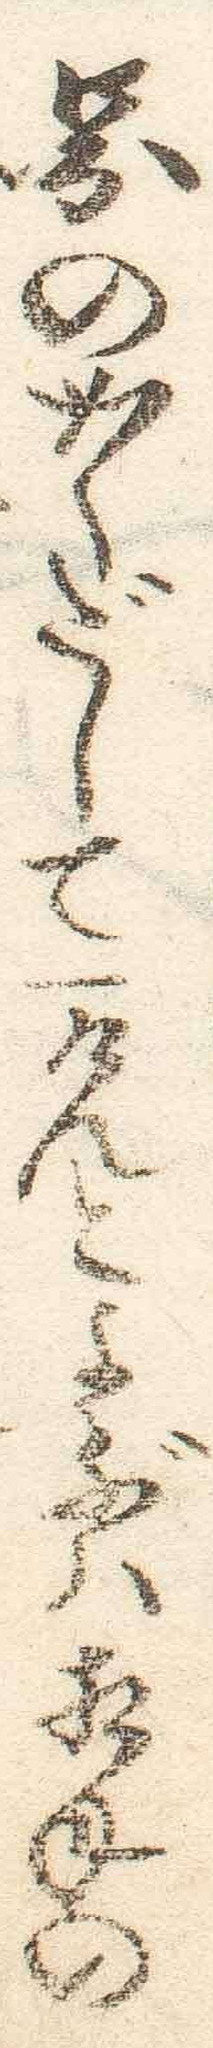図の如くだして一けんとよぶは相手の
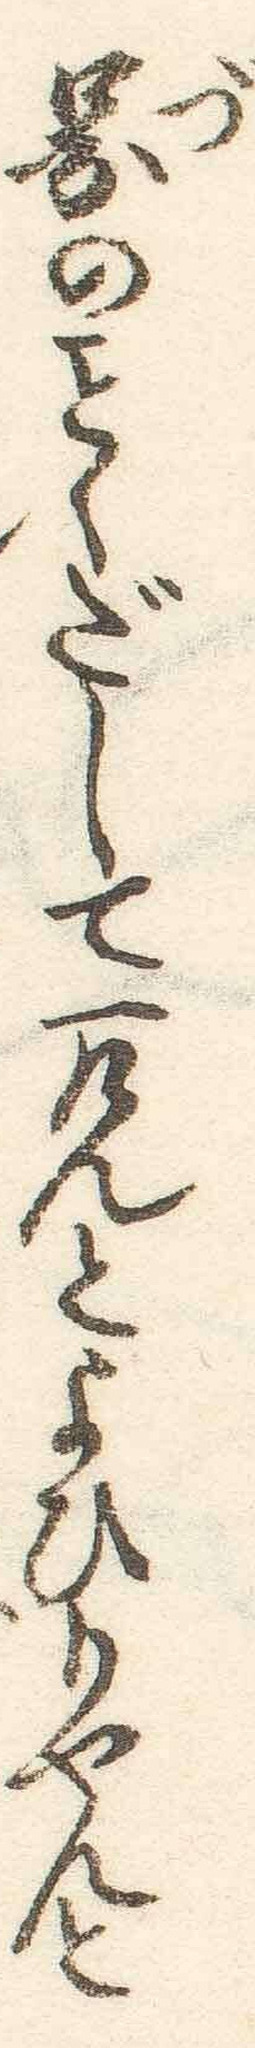図のことくだして一けんとよひりやんと
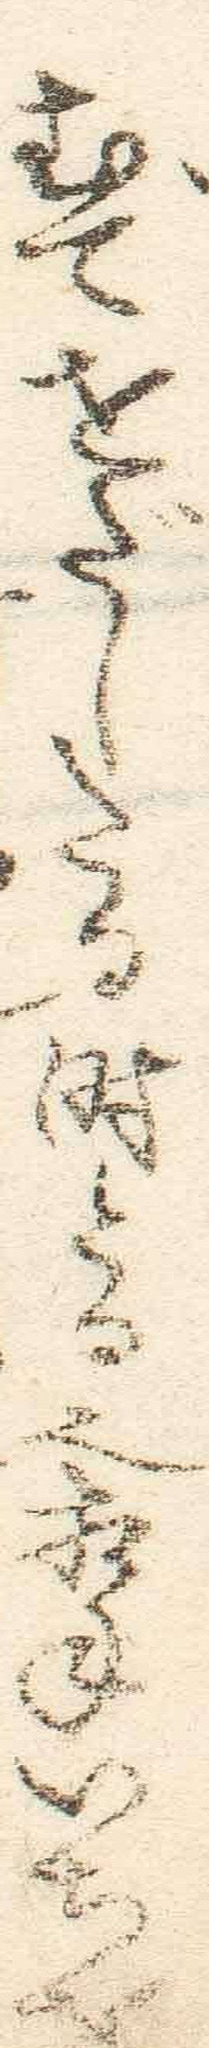むてを出したる時とる也相手いちを
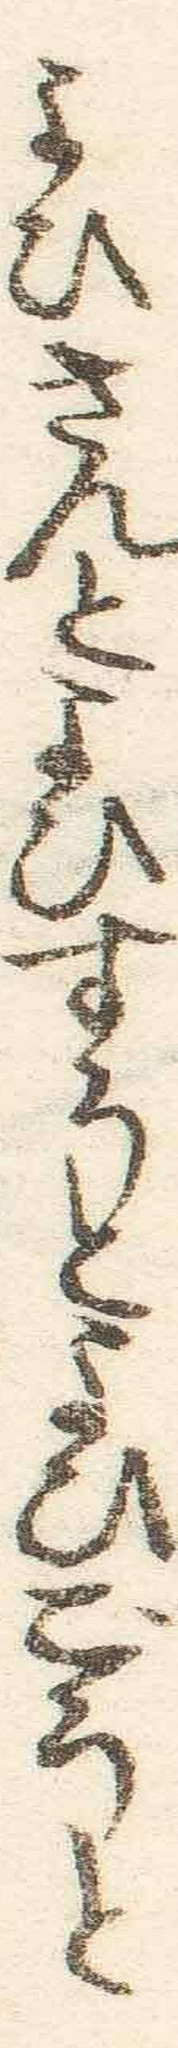よひさんとよひすうとよひごうと
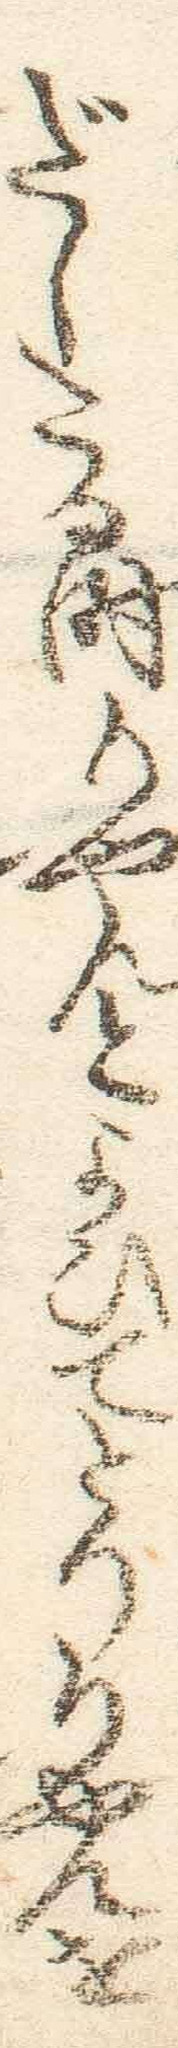だしたる時りやんとよひてとりりやんを
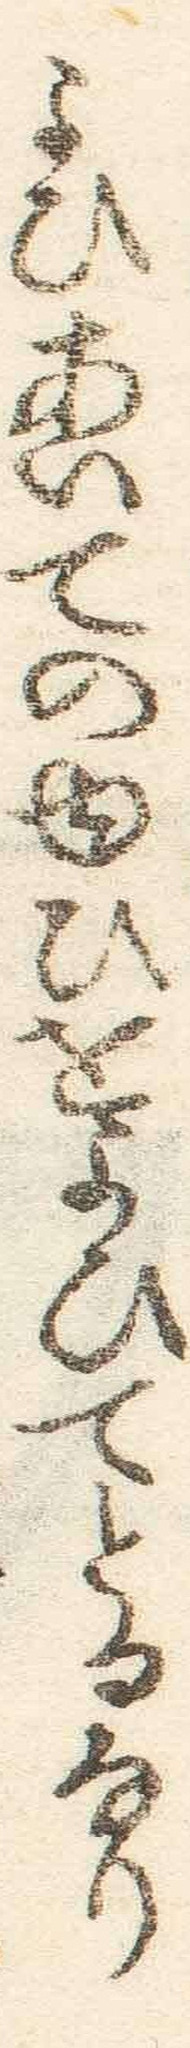よひあいてのゆひをよひてとるなり
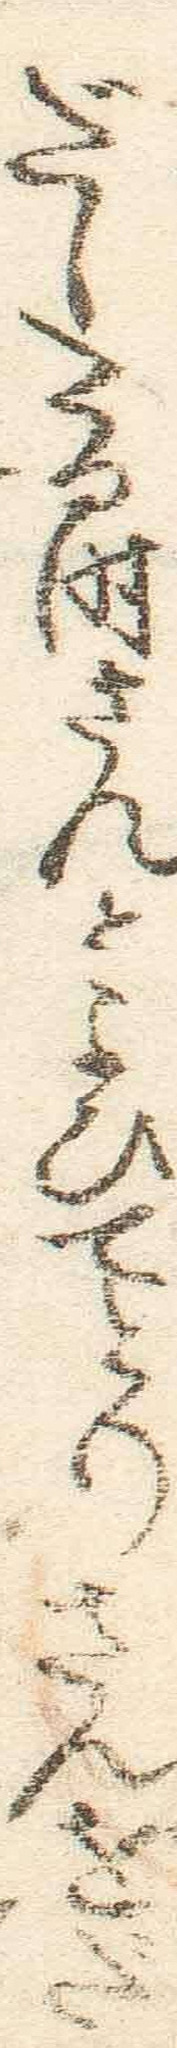だしたる時さんとよひてとりさんをだ
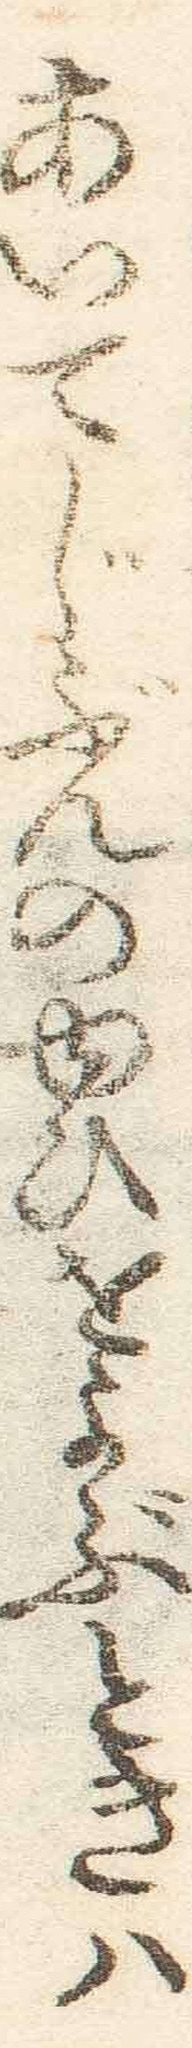あいてじぶんのゆひをよぶときは
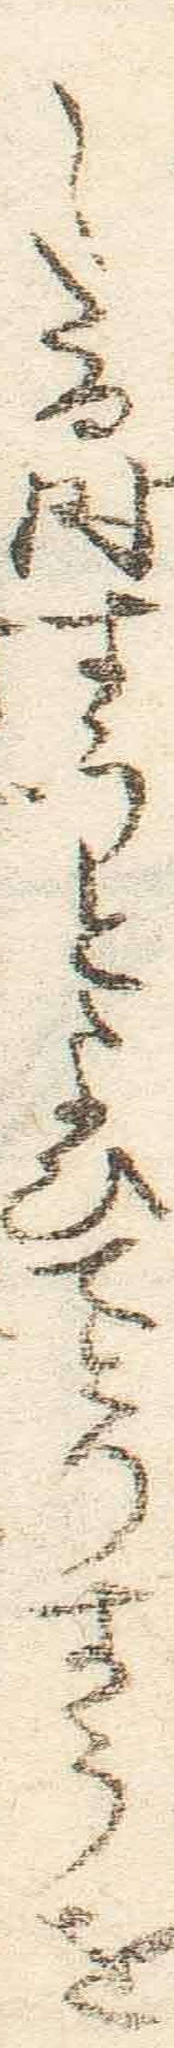したる時すうとよひてとりすうを
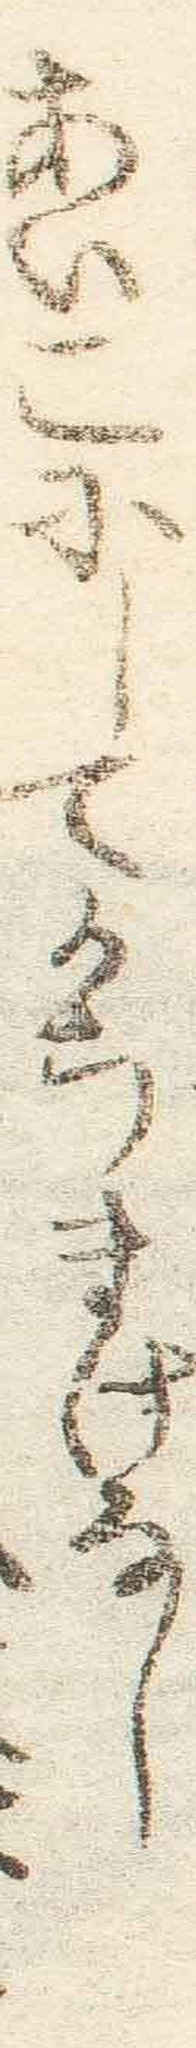あいこにしてかちまけなし
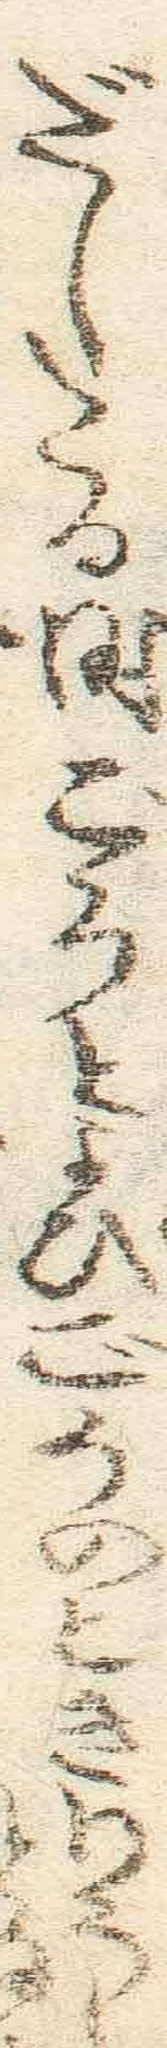だしたる時ごうとよひごうのときりうととる也
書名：拳独稽古
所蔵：東京学芸大学附属図書館 国文学研究資料館
